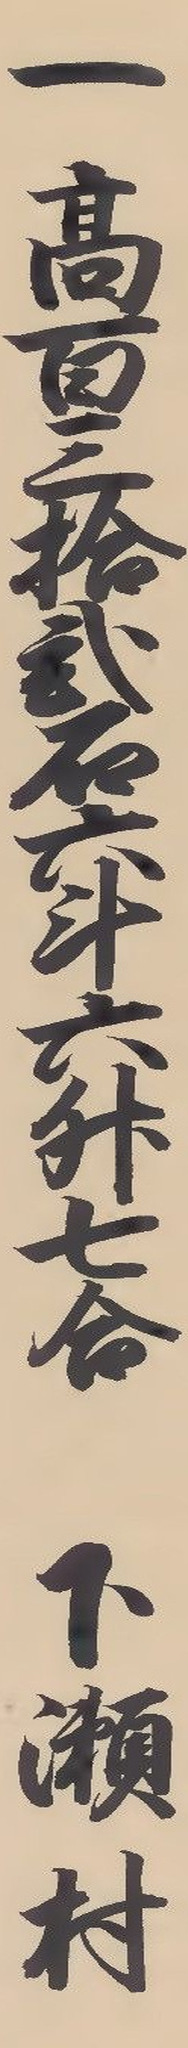一高百三拾弐石六斗六升七合下瀬村
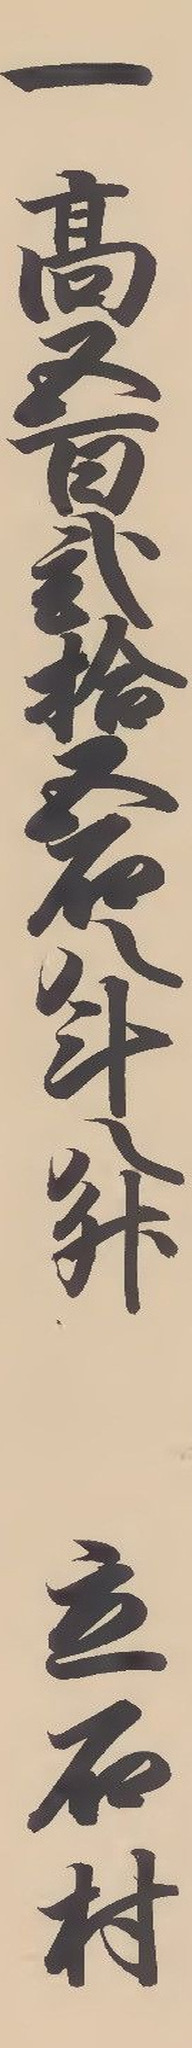一高五百弐拾五石八斗八升立石村
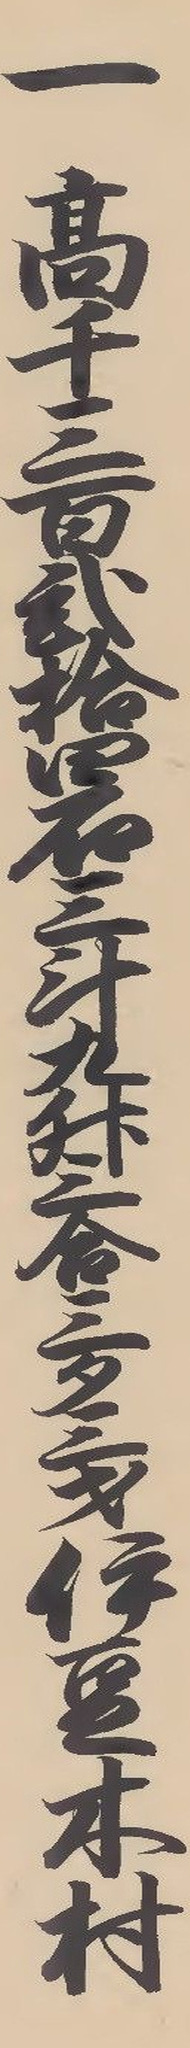一高千三百弐拾四石三斗九升三合三勺三才伊豆木村
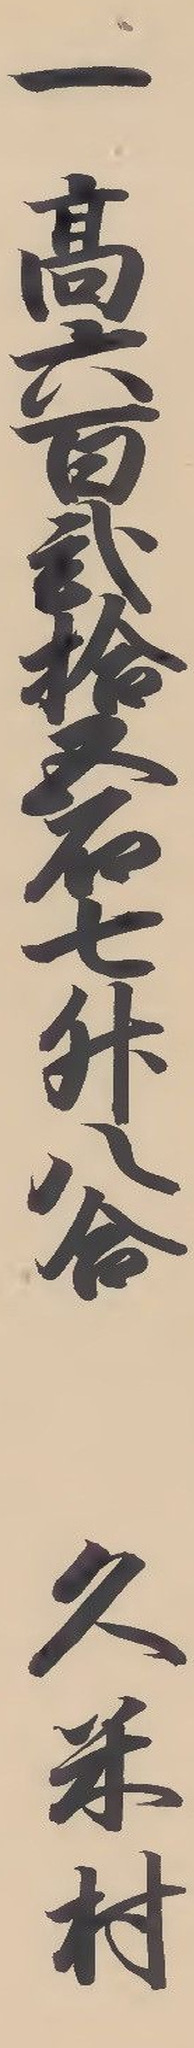一高六百弐拾五石七升八合久米村
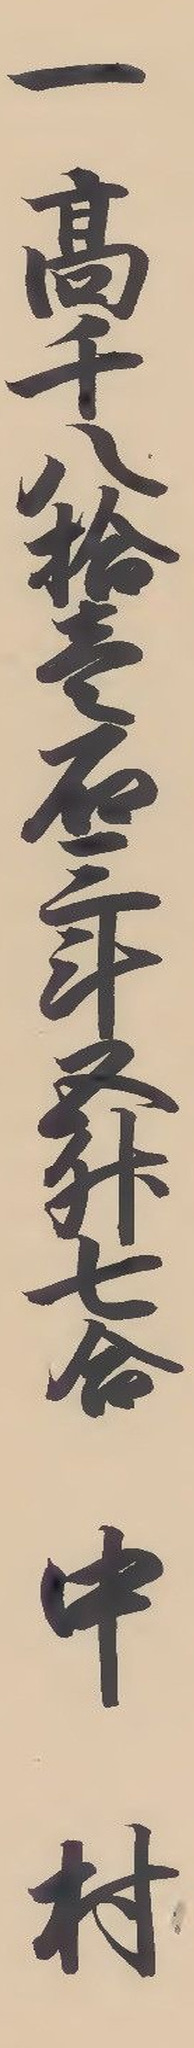一高千八拾壱石三斗五升七合中村

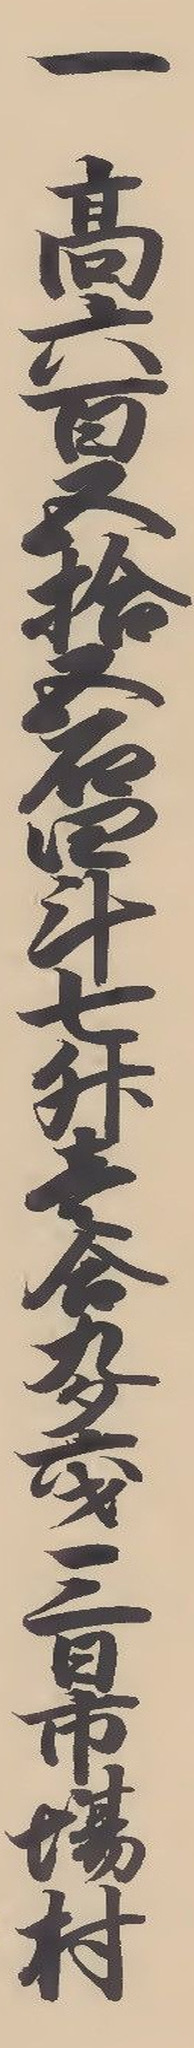一高六百五拾五石四斗七升壱合九勺六才三日市場村
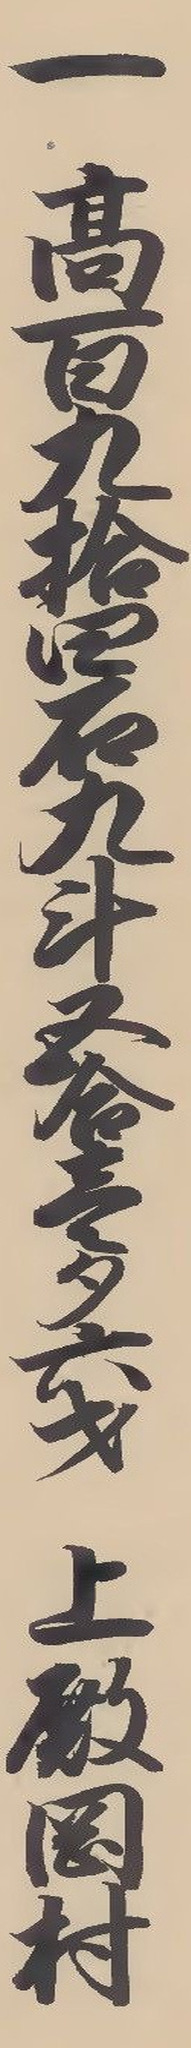一高百九拾四石九斗五合壱勺六才上殿岡村
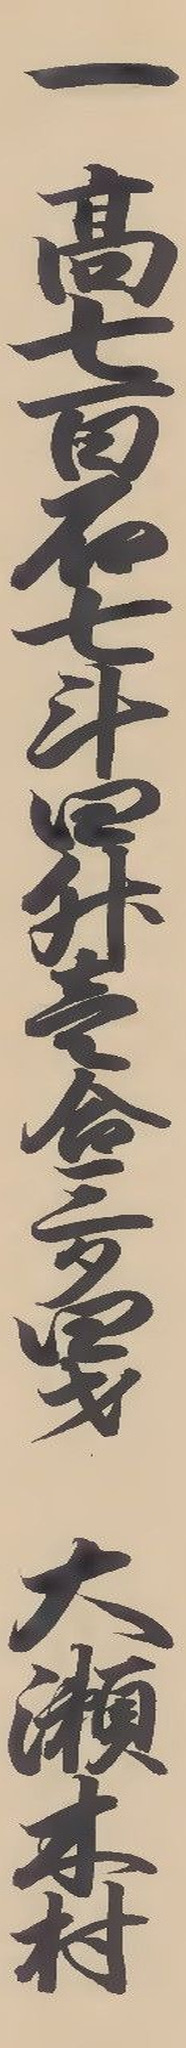一高七百石七斗四升壱合三勺四才大瀬木村
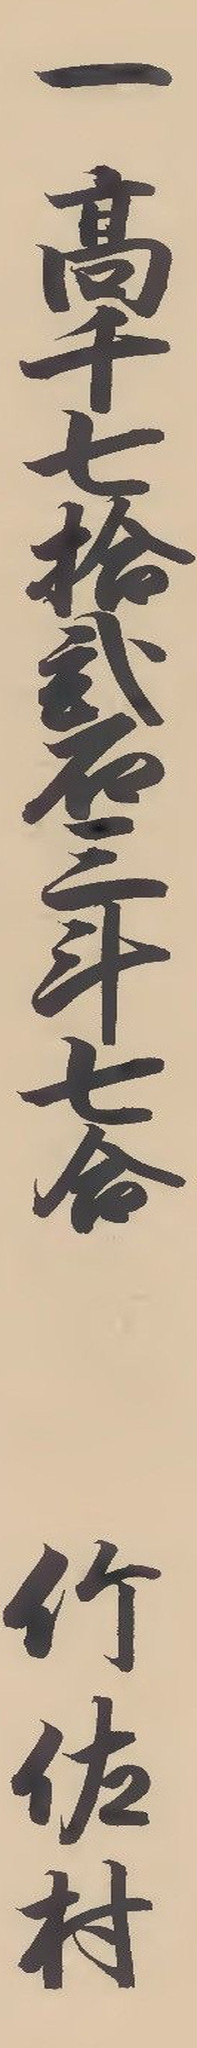一高千七拾弐石三斗七合竹佐村
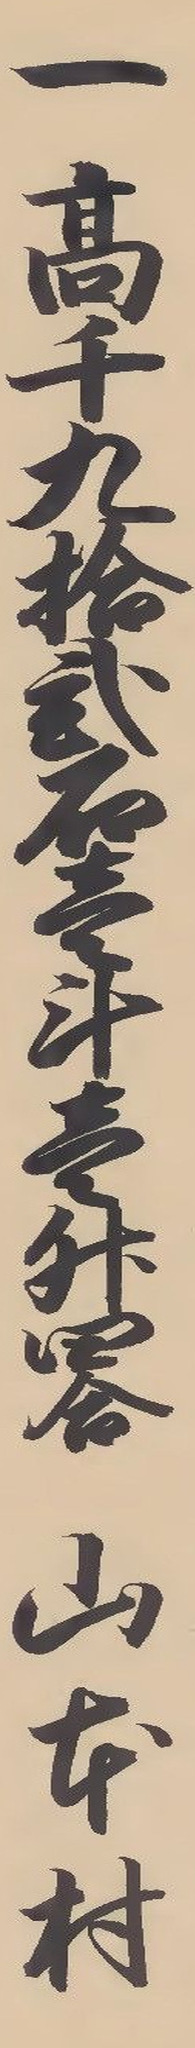一高千九拾弐石壱斗壱升四合山本村
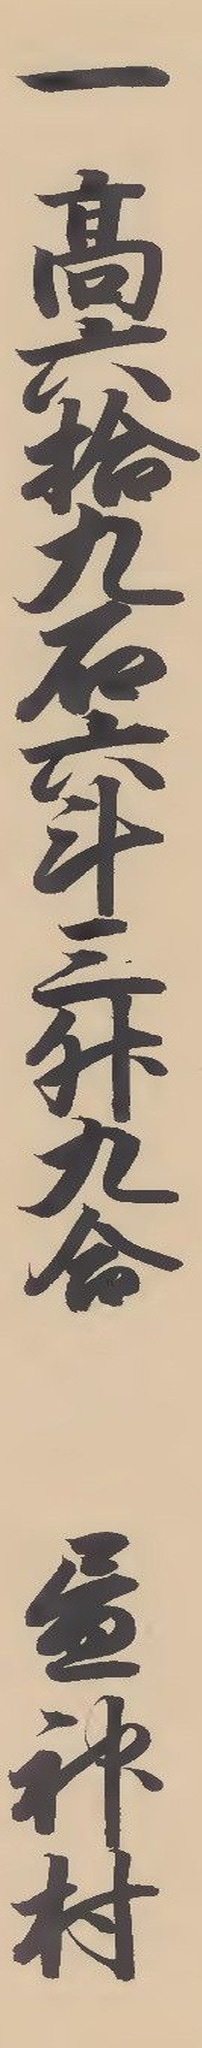一高六拾九石六斗三升九合昼神村
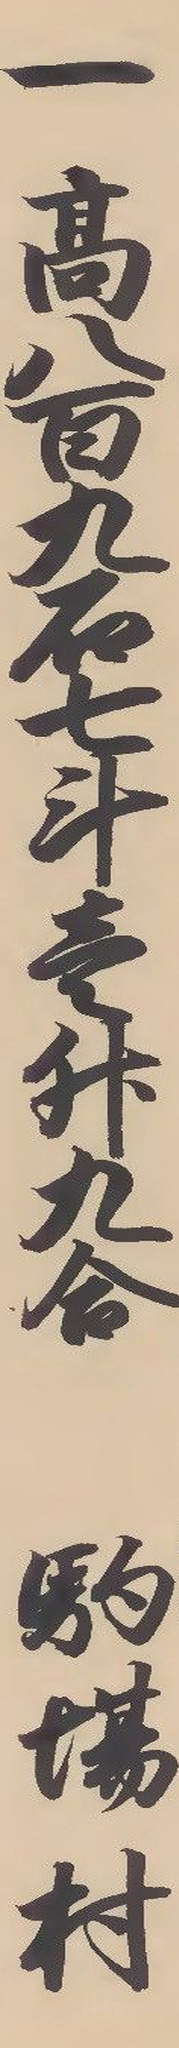一高八百九石七斗壱升九合駒場村
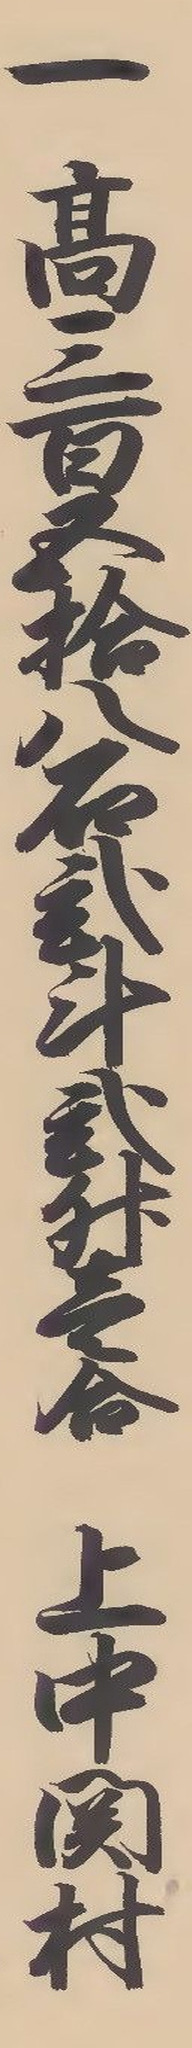一高三百五拾八石弐斗弐升壱合上中関村

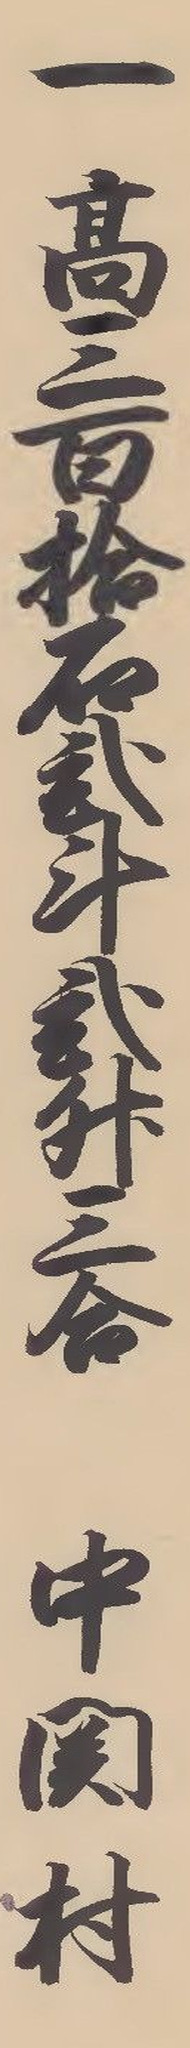一高三百拾石弐斗弐升三合中関村
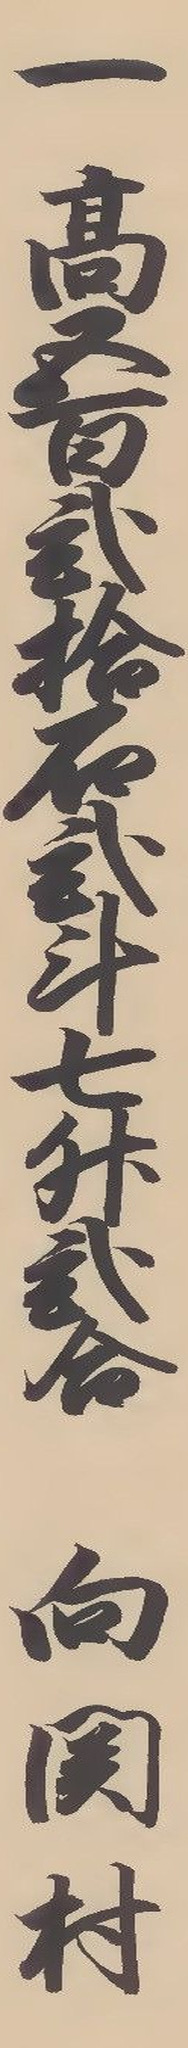一高五百弐拾石弐斗七升弐合向関村
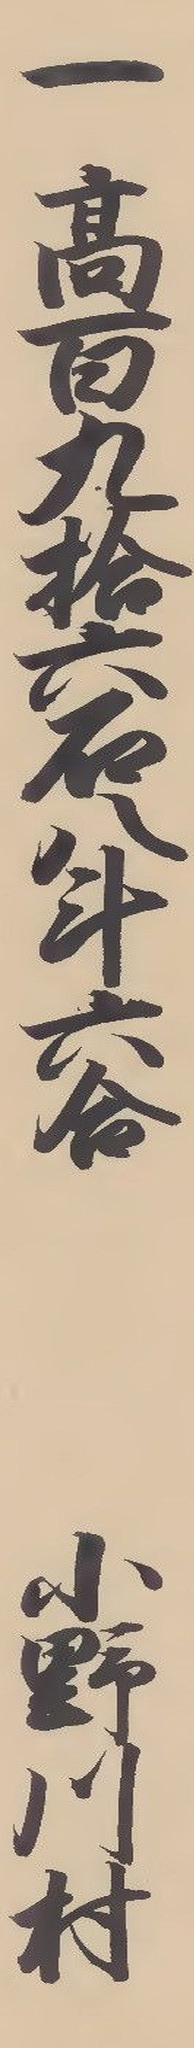一高百九拾六石八斗六合小野川村
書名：信濃国郷帳
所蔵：国立公文書館 National Archives of Japan
